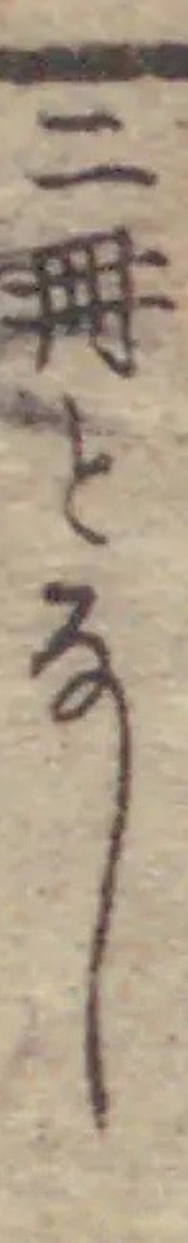二冊となし
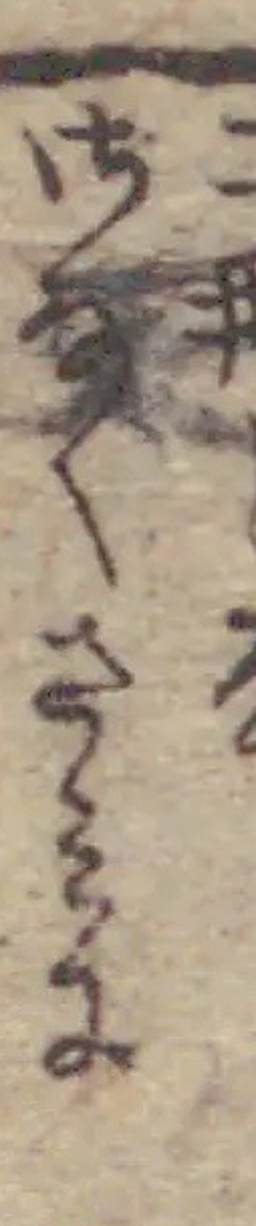御なくさみに
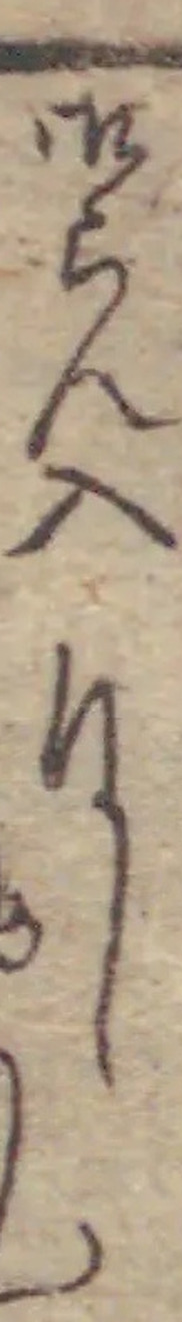御らん入れし

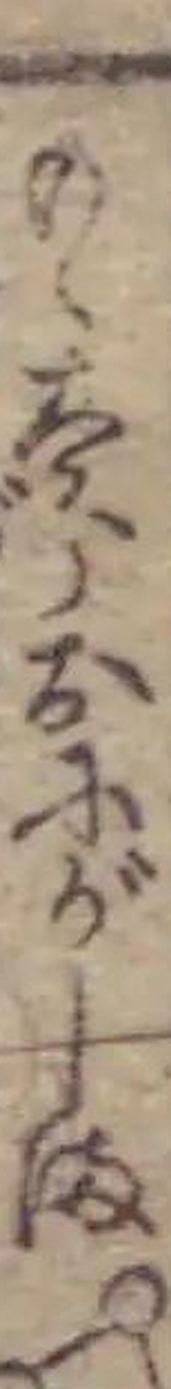もゝ太郎おにがしま
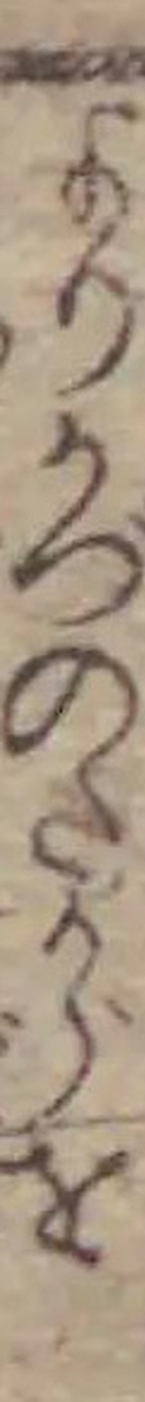よりかづのたからを
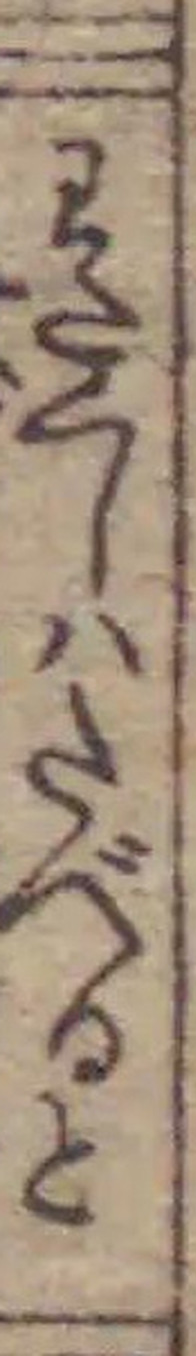わたくしはたべると
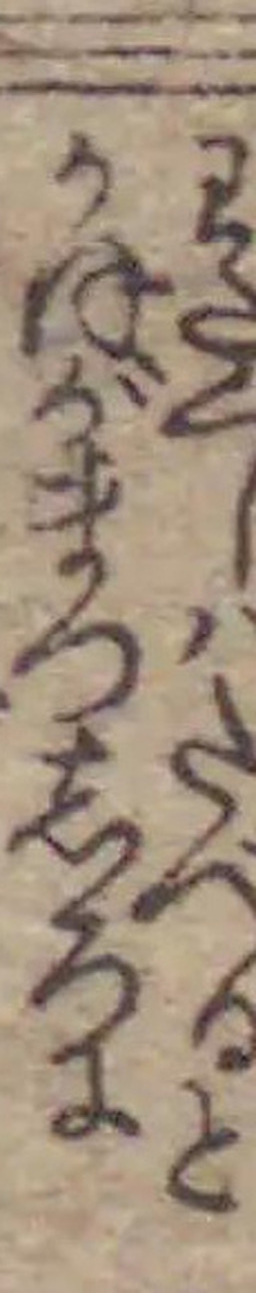かほがまつしろに
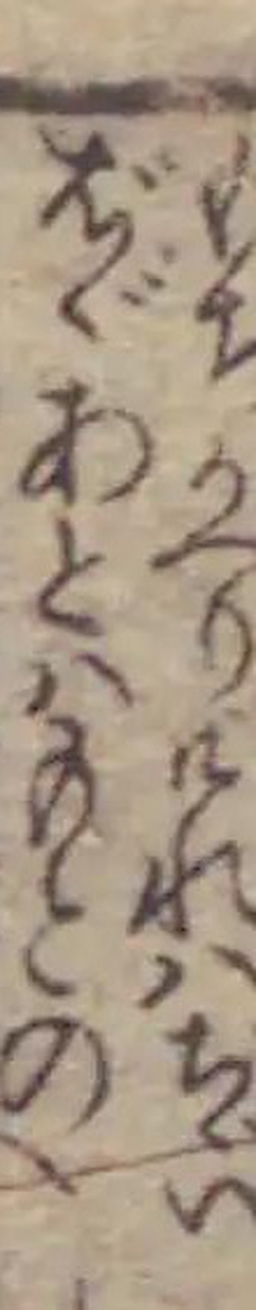ばゞあとはもとの
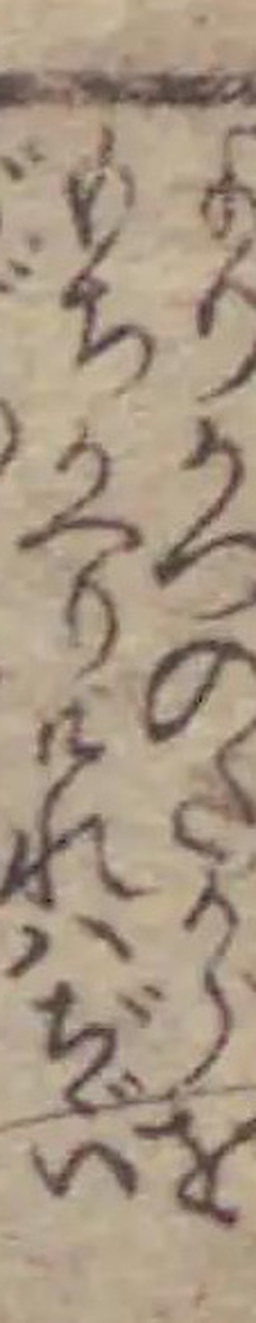もちかへりければぢゞい
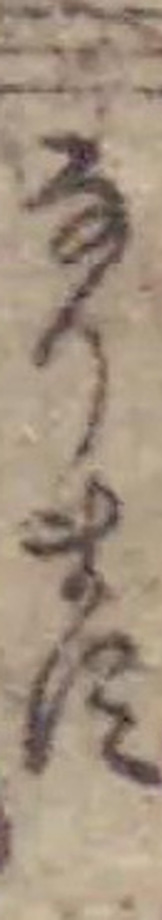なります
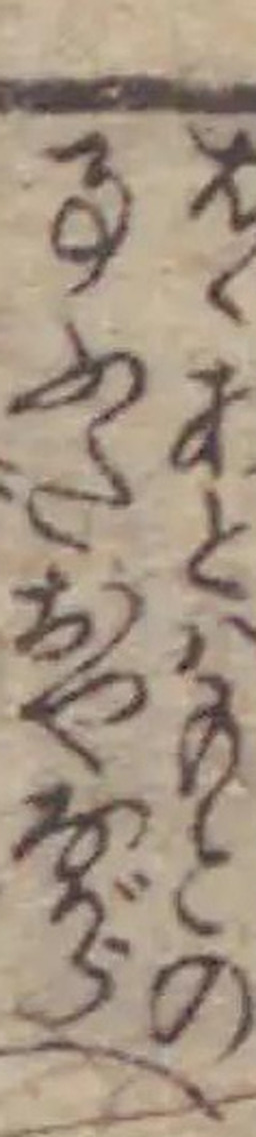事ふたおやながら
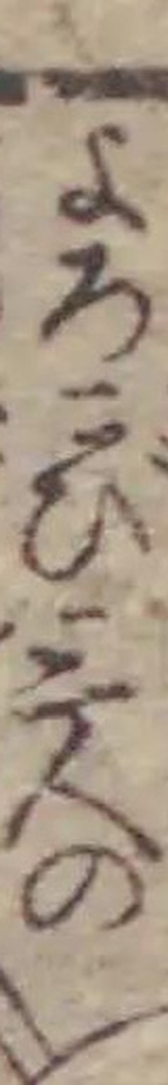よろこび三人の
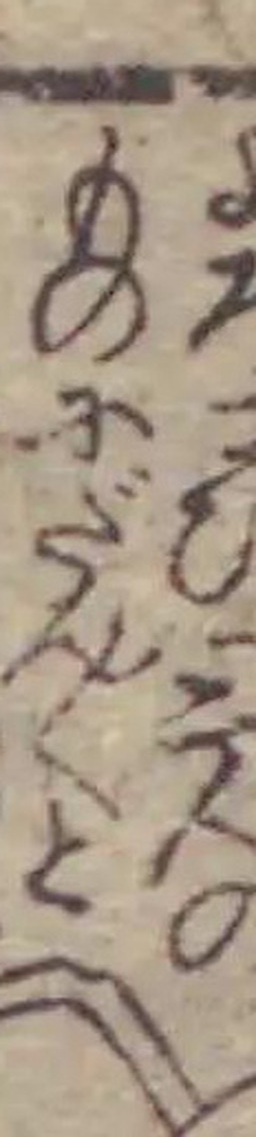ものにだん〳〵と
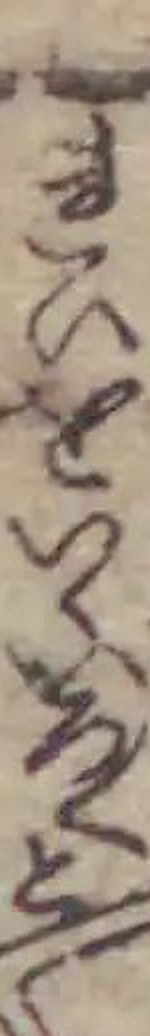れいをいゝいろ〳〵と
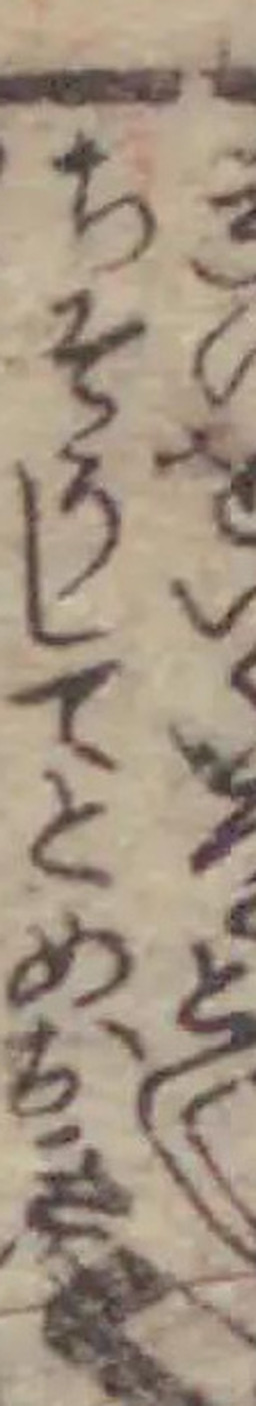ちそうしてとめおき
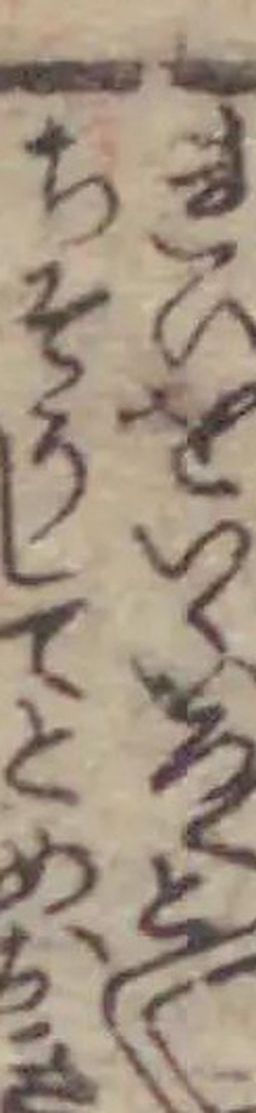ちそうしてとめおき
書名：桃太郎元服姿 2巻
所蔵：国立国会図書館 National Diet Library, JAPAN
